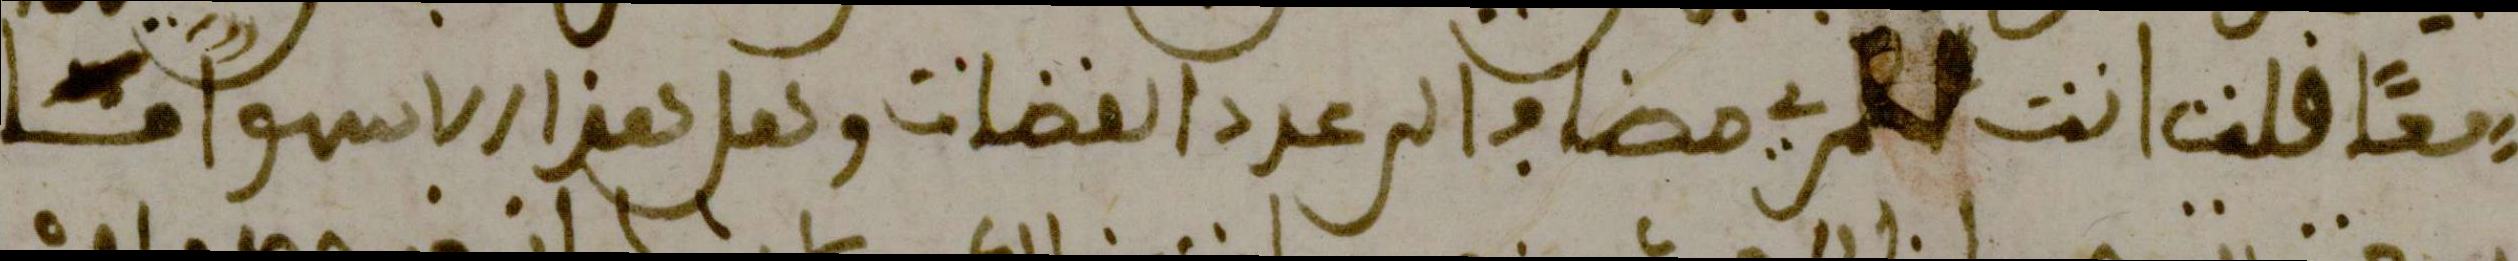معا قلت انت لعمري مضاف الى عدد القضات وهل هذا الاسهو اما
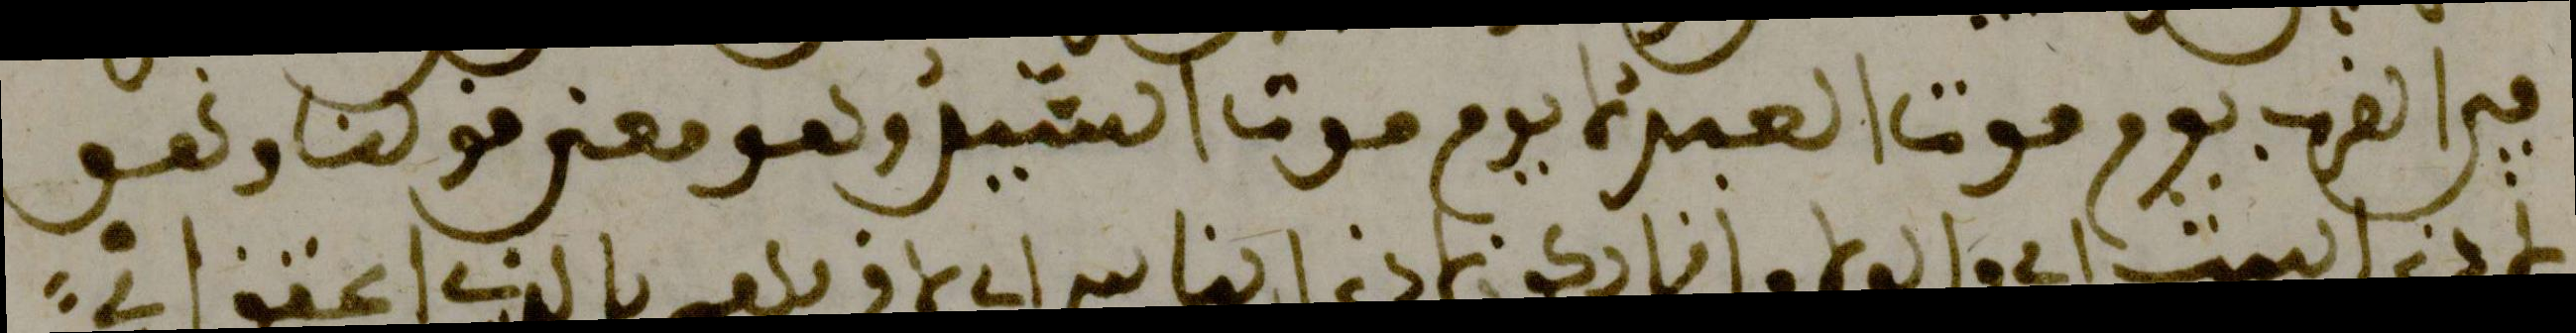في القرب يوم موت العبد لا يوم موت السيد وهو معنى قولنا وهو
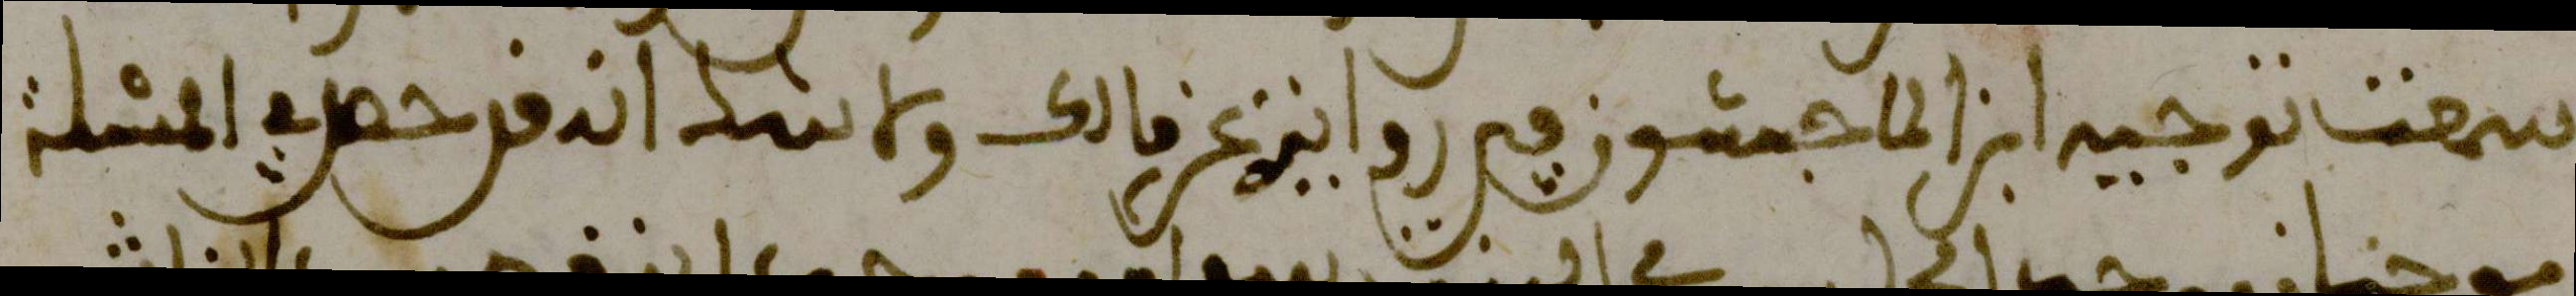سمعت توجيه ابن الماجشون في روايته عن مالك ولا شك انه قد حصل في المسلة
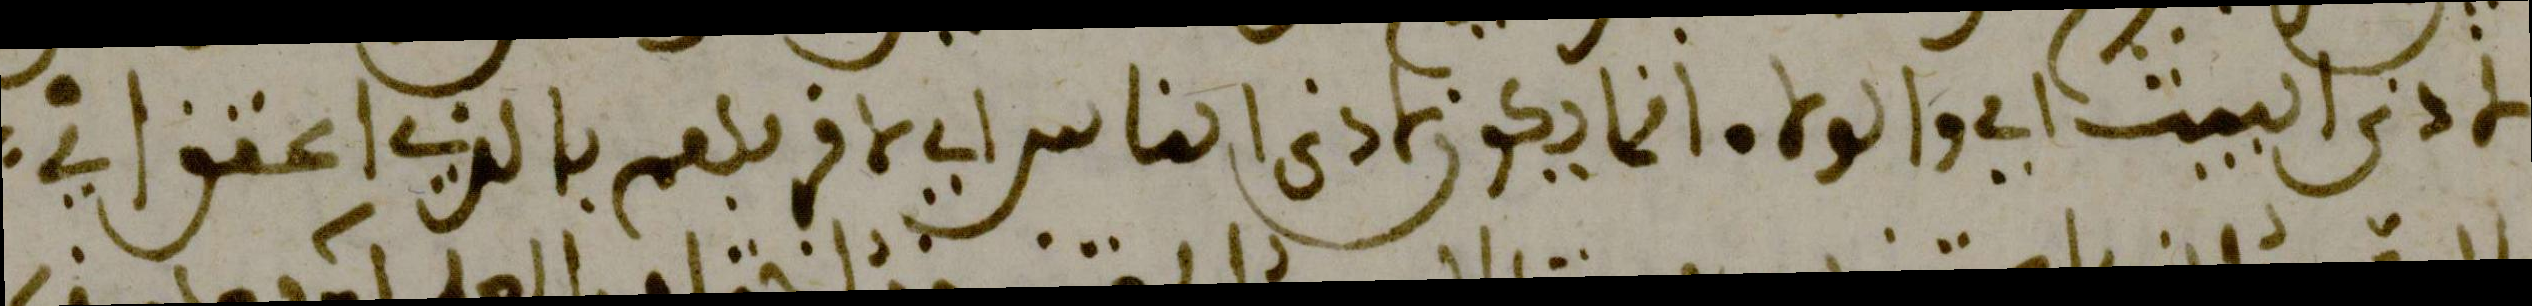لادنى البيت اي والولاء انما يكون لادنى الناس اي لا قربهم بالذي اعتق اي
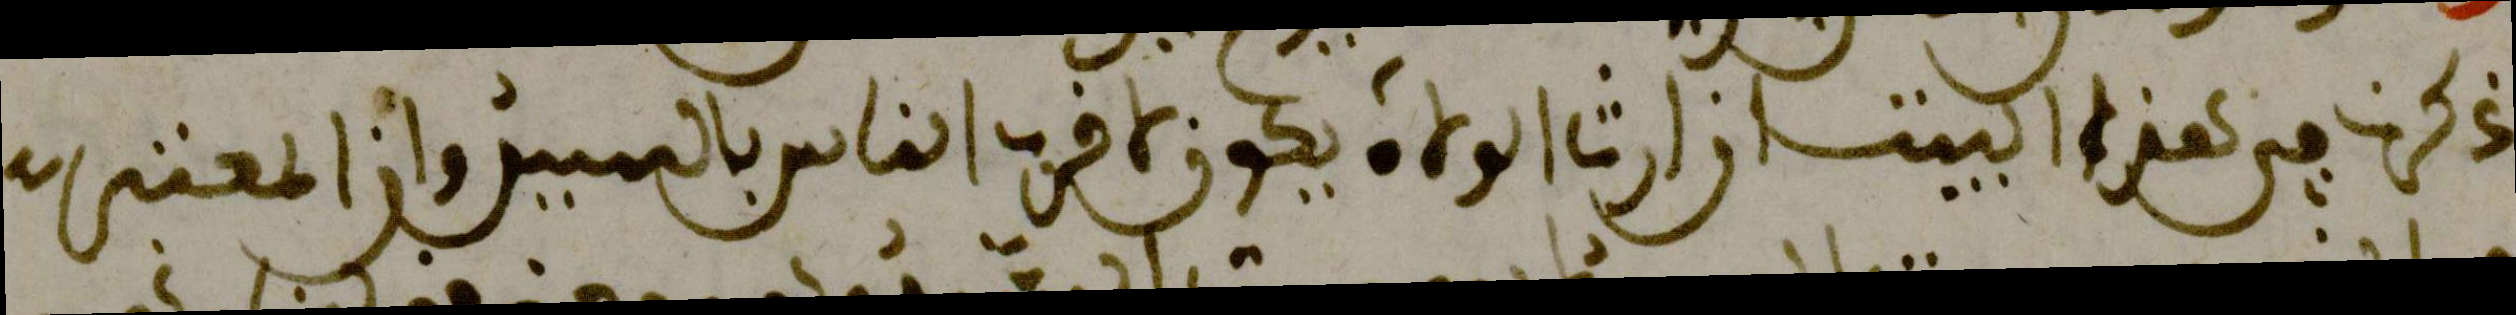ذكرن في هذا البيت ان ارث الولاء يكون لا قرب الناس بالسيد وان المعتبر
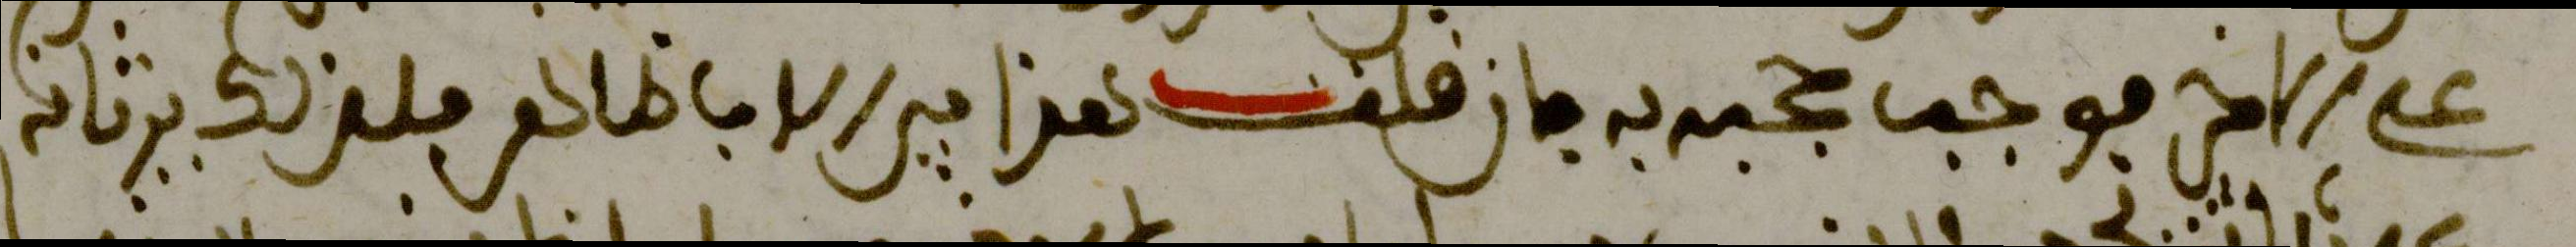على الاخر فوجب حجبه به فان قلت هذا في الاب ظاهر فلذلك يرثانه
